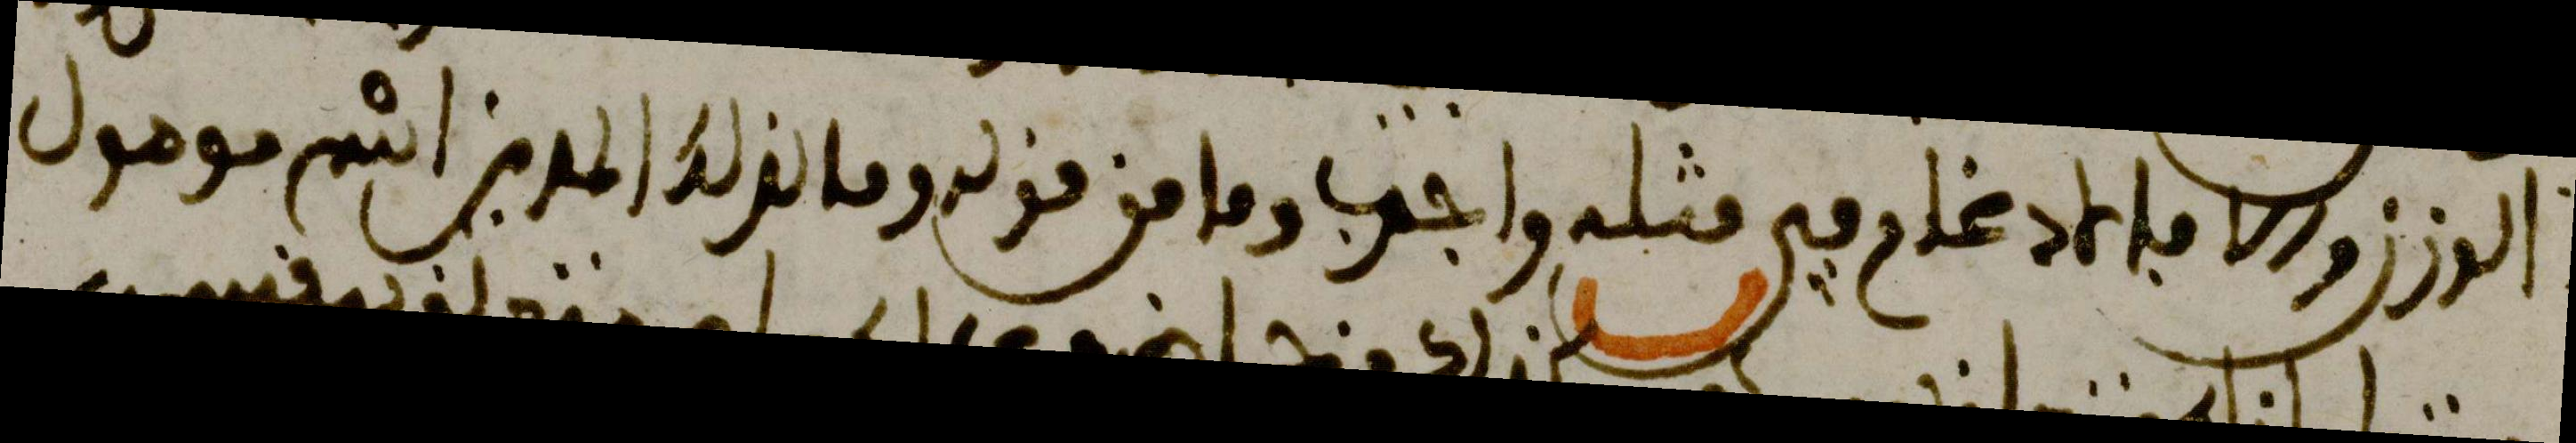الوزن والافا لا دغام في مثله واجدب وما من قوله وما لذلك المدين اسم موصول
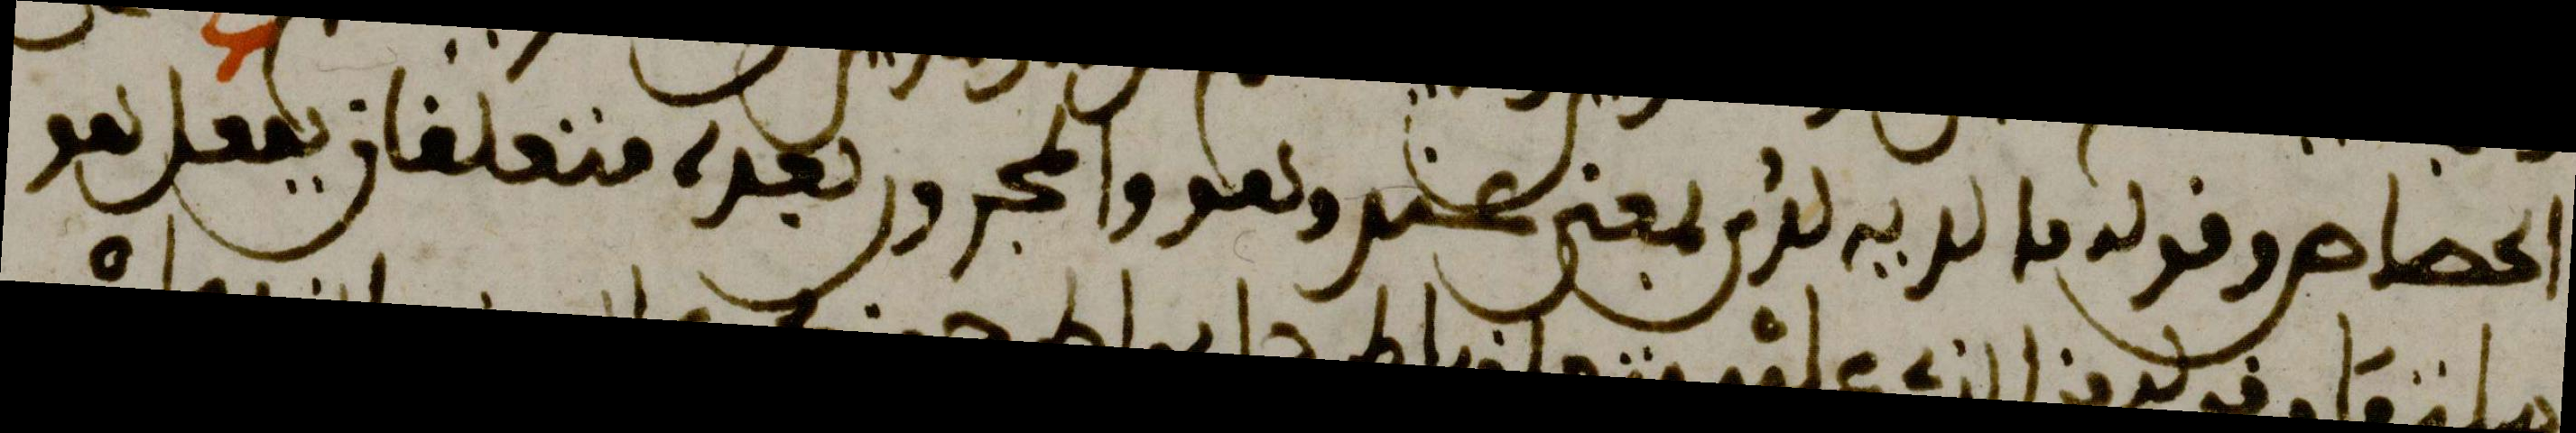الحصاص وقوله ما لديه لدى بمعنى عند وهو والمحجرور بعده متعلقان بفعل هو
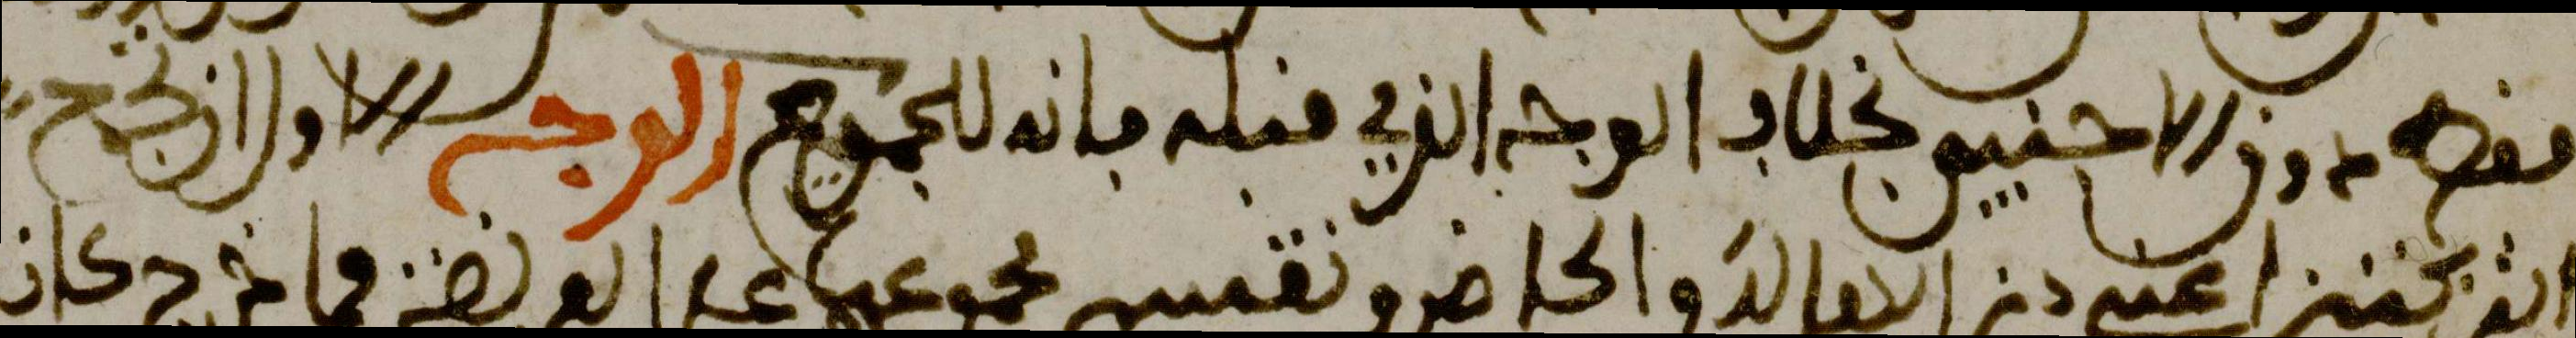فقط دون الاجنبي بخلاف الوجه الذي قبله فانه للجميع الوجه الاول ان تجمع
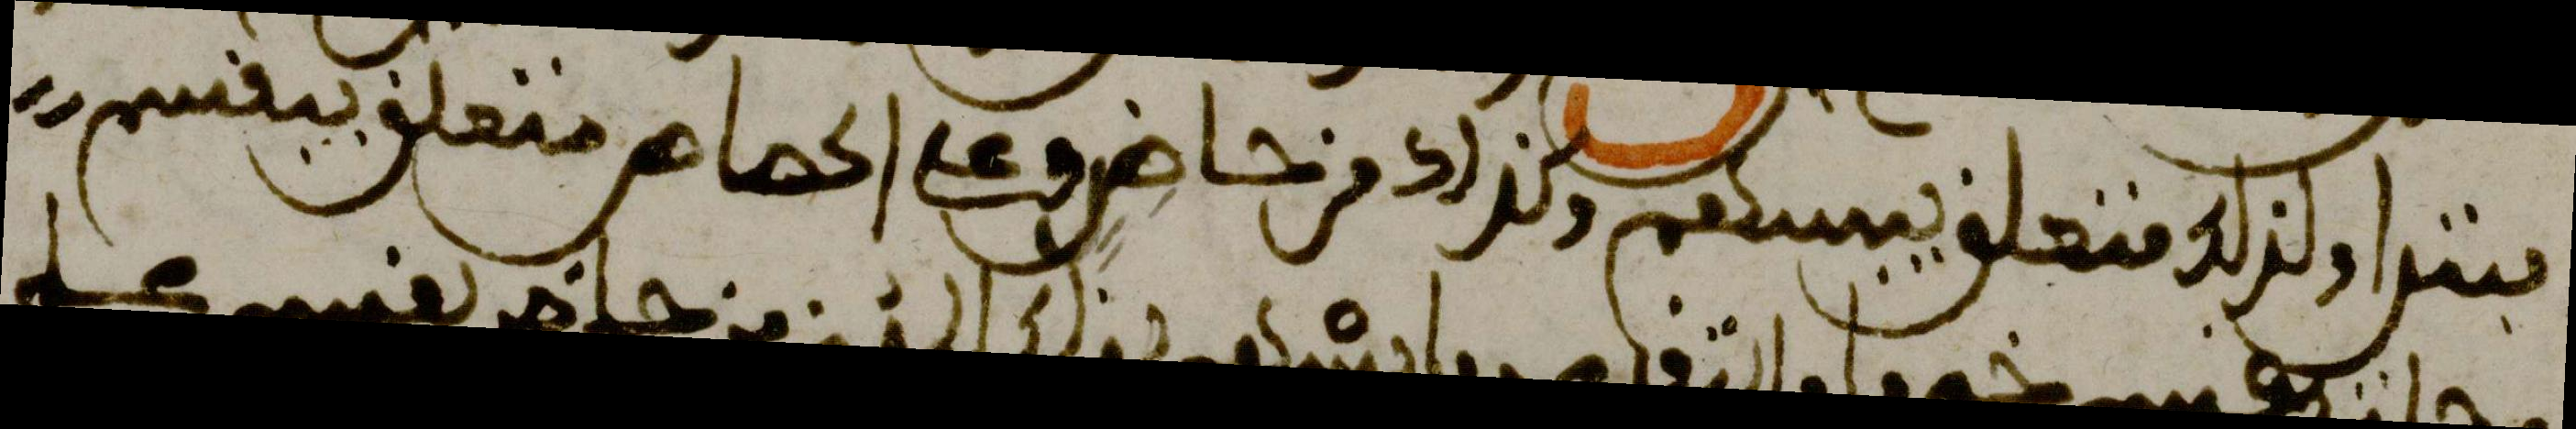مبتدا ولذلك متعلق بيسهم وكذلك من حاض و على الحصاص متعلق بيقسم
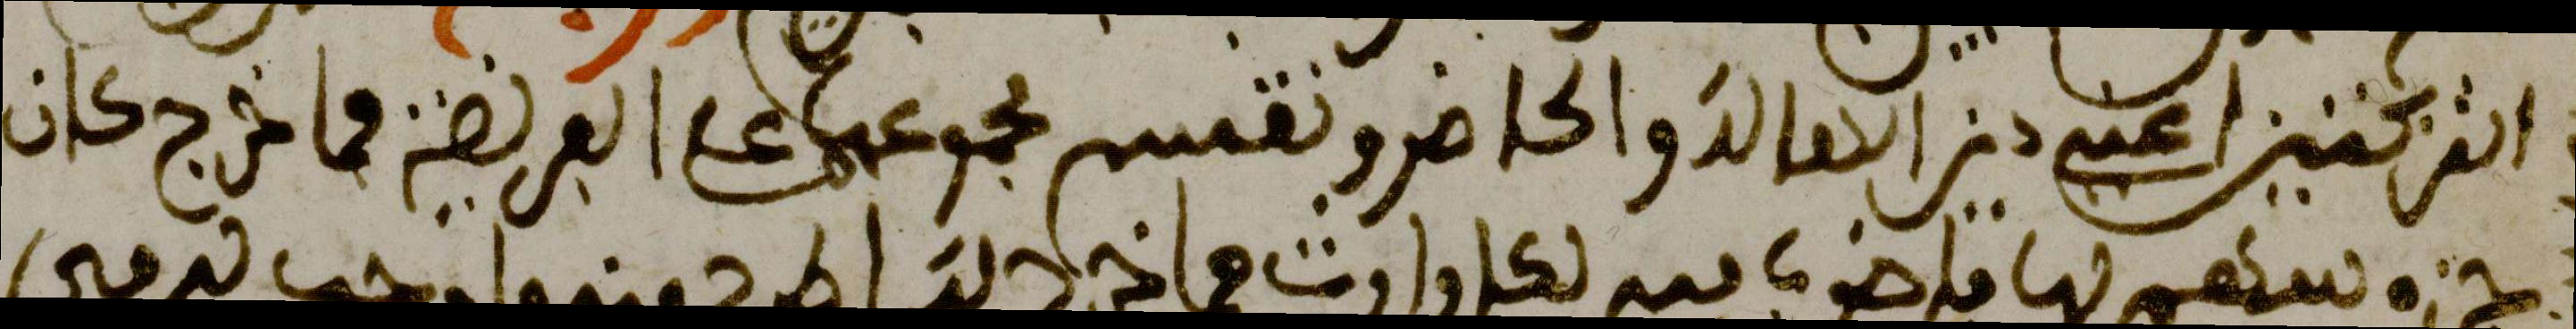التركتين اعني دين الهالك والحاضر وتقسم مجموعها على الفريضة فما خرج كان
